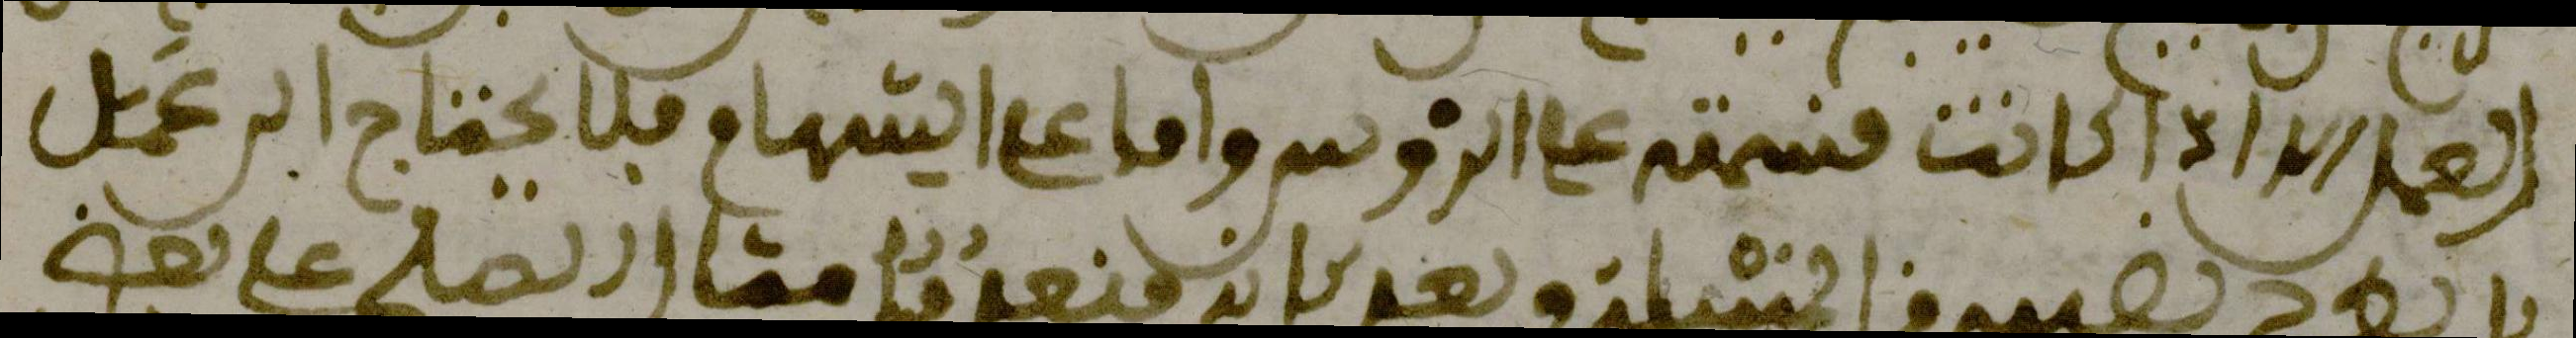العمل الا اذا كانت قسمته على الرءوس وأما على السِّهام فلا يحتاج الى عَمَل
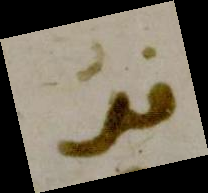قد
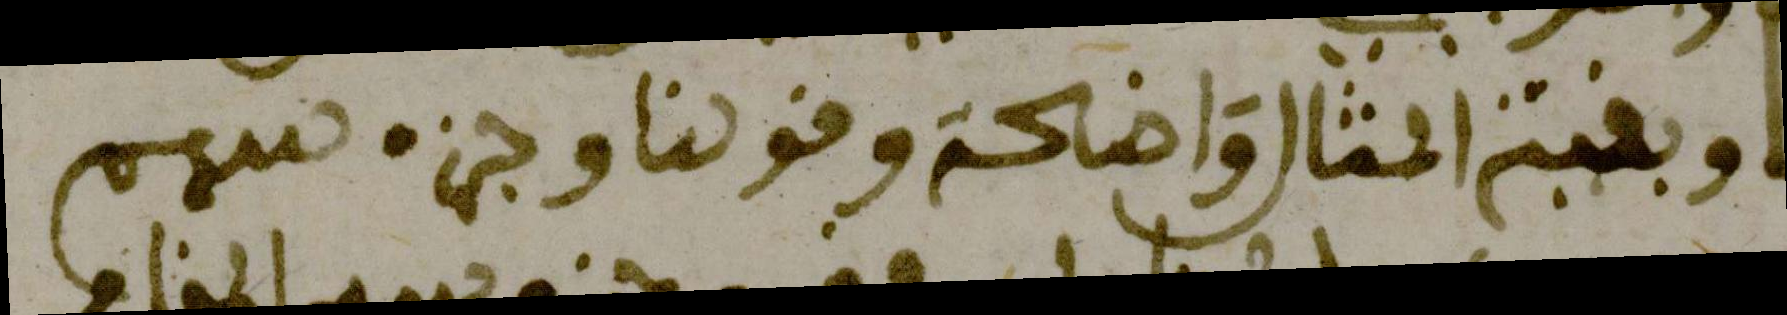وبقية المثال وَاضحة وقولنا وجزء سهم
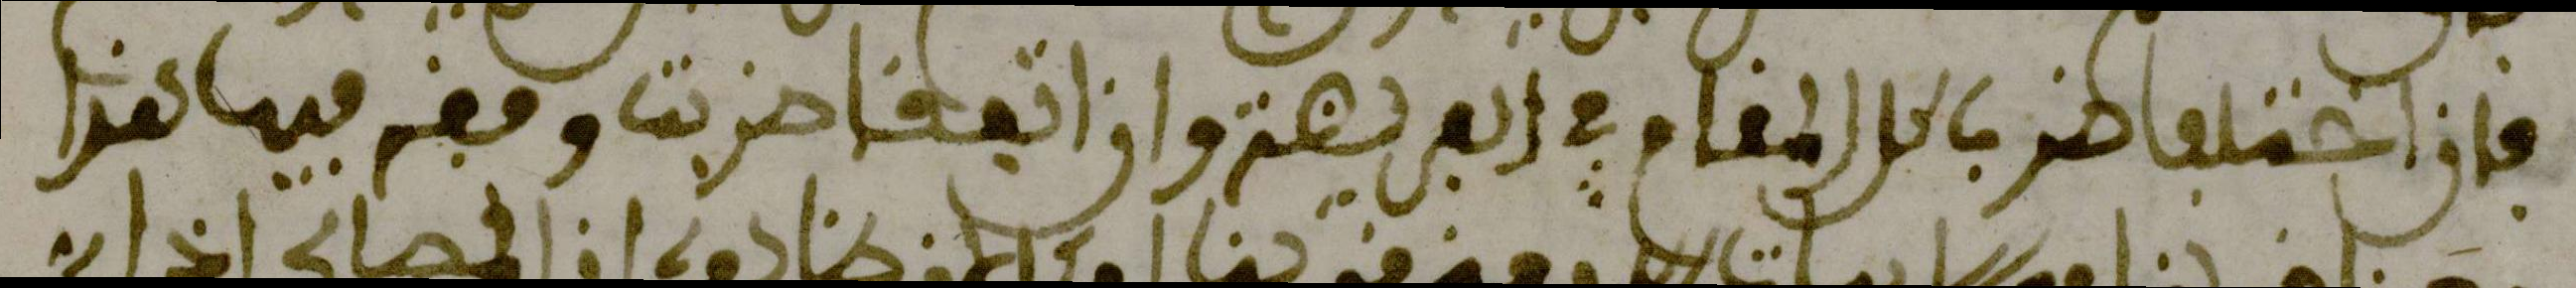فان اختلفا ضرب كل المقام في الفريضة وان اتفقا ضربت وفقه فيها هذا
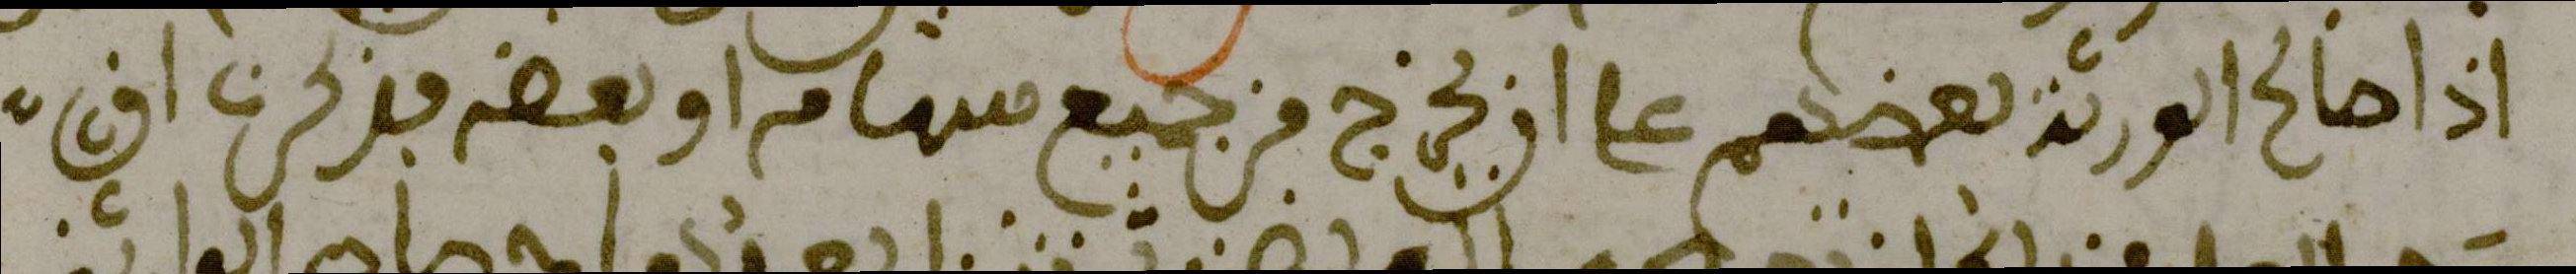اذ صالح الورثة بعضهم على ان يخرج من جميع سهامه او بعضه فذكرن ان
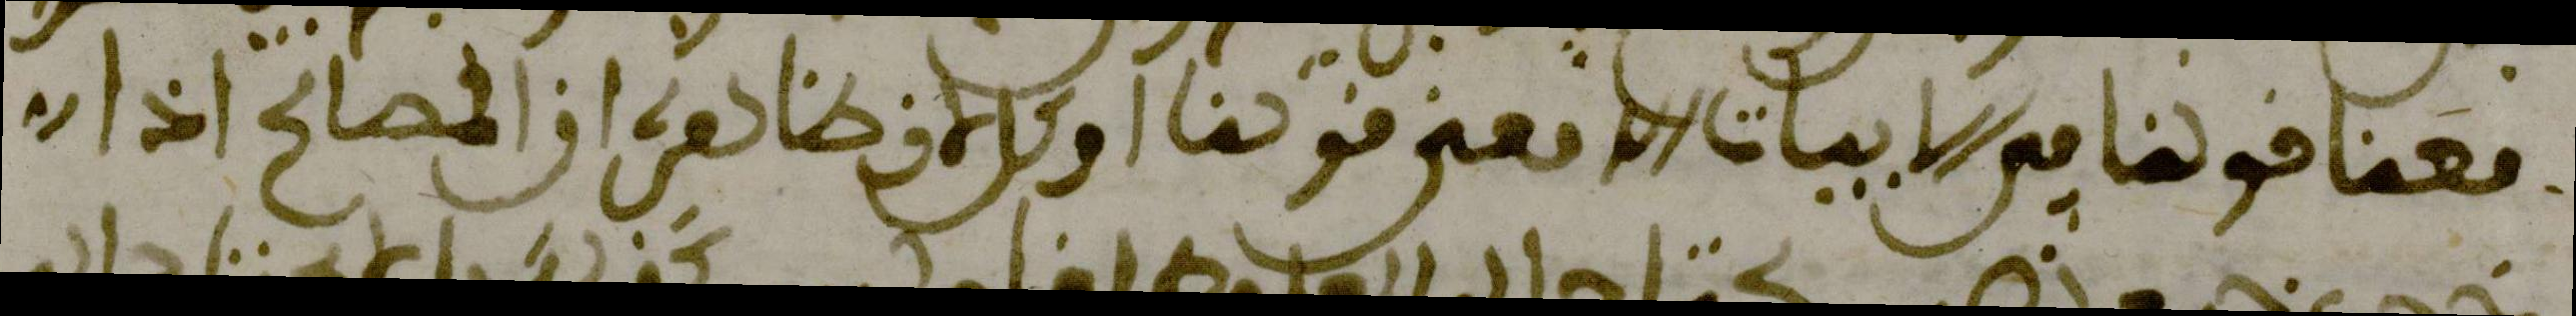معنا قولنا في الابيات الا معنى قولنا وكل لان طاهره ان المصالح اذا
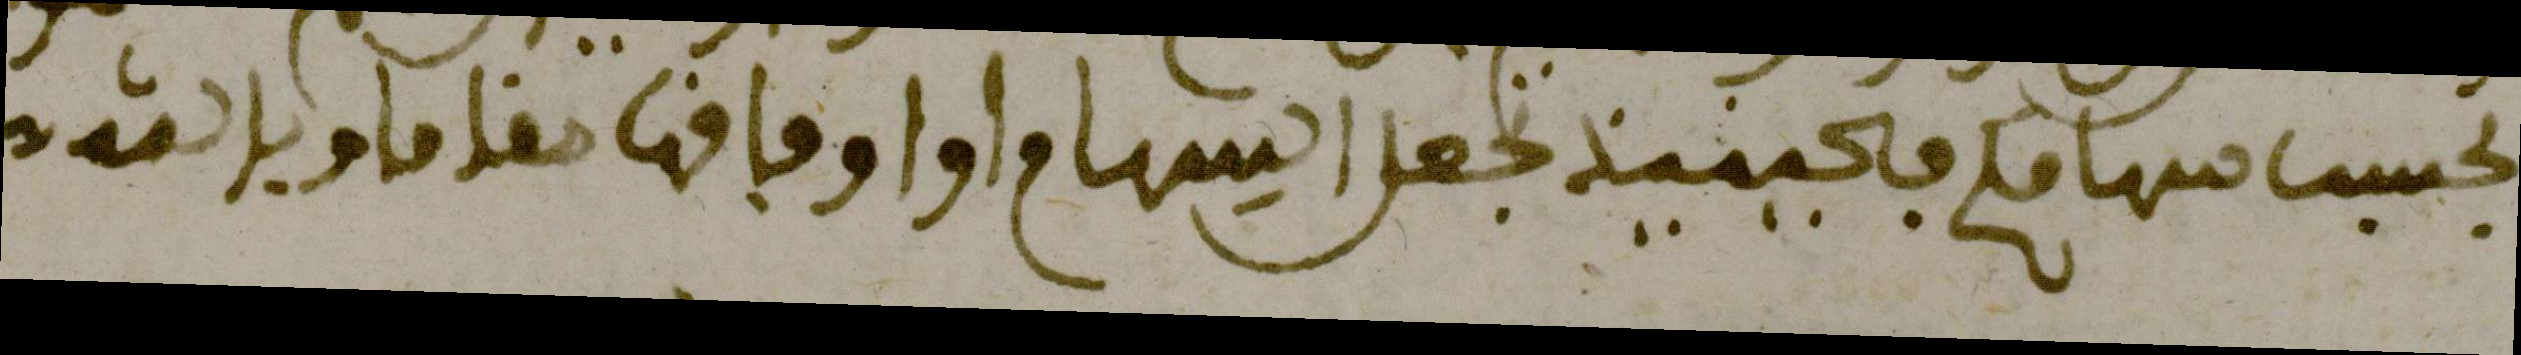بحسب سهامكم فحينيذ تجعل السِهام او اوفاقها مقاما وبالله
